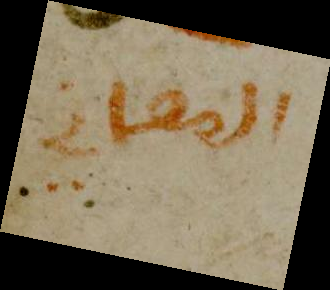المعاني
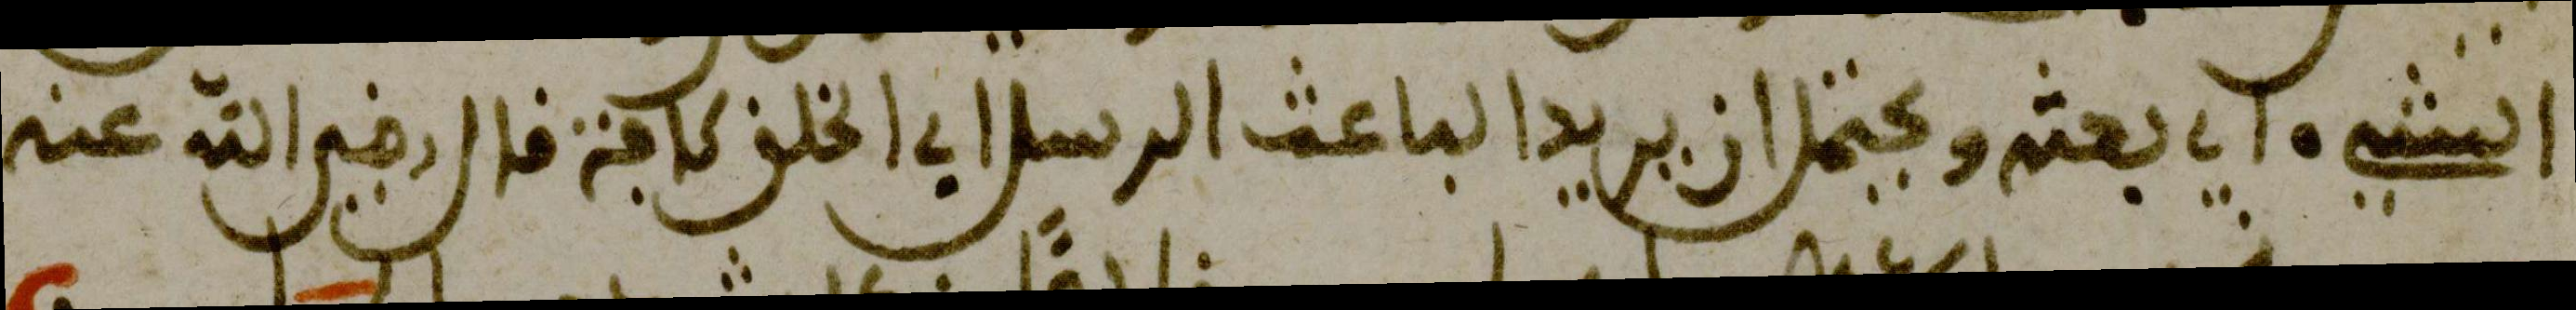الشيء اي بعثه ويحتمل ان يريد الباعث الرسل اي الخلق كافة قال رضي الله عنه
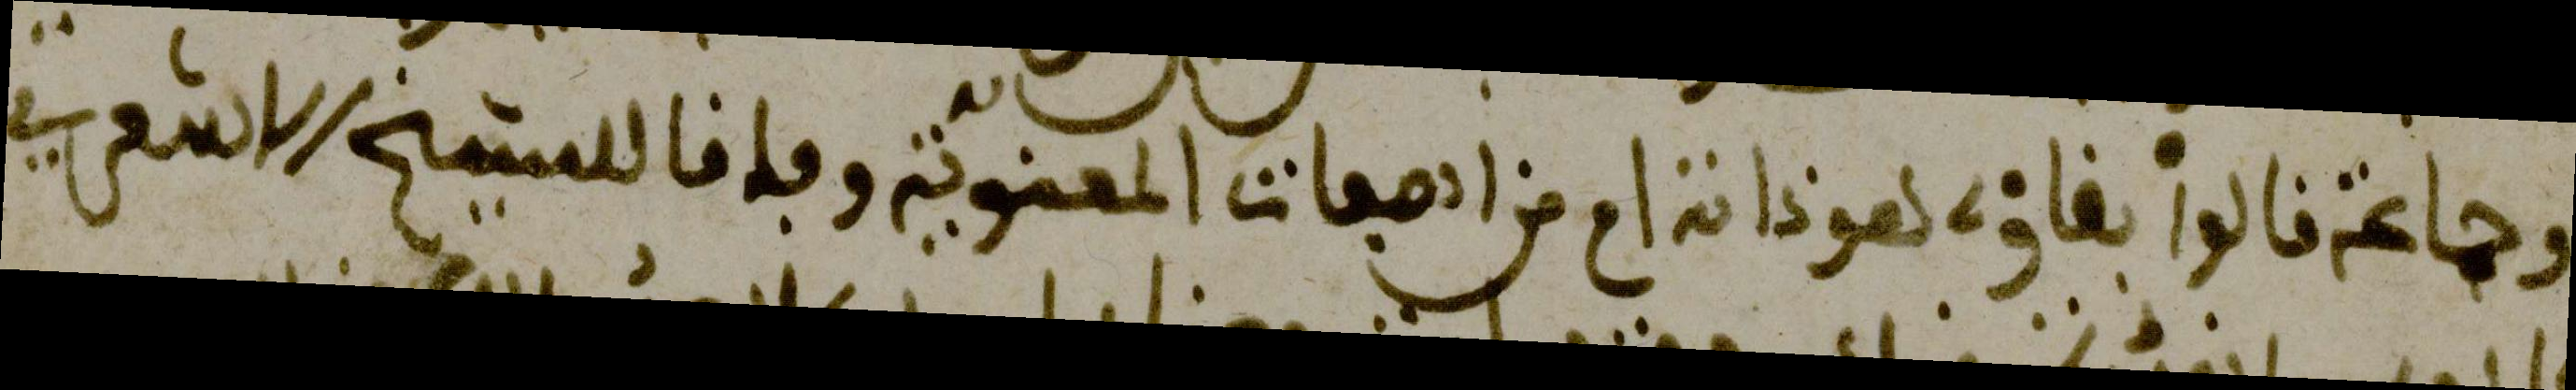وجماعة قالو ابقاؤه هو ذاته ام من الصفات المعنوية وفاقا للشيخ الاشعري
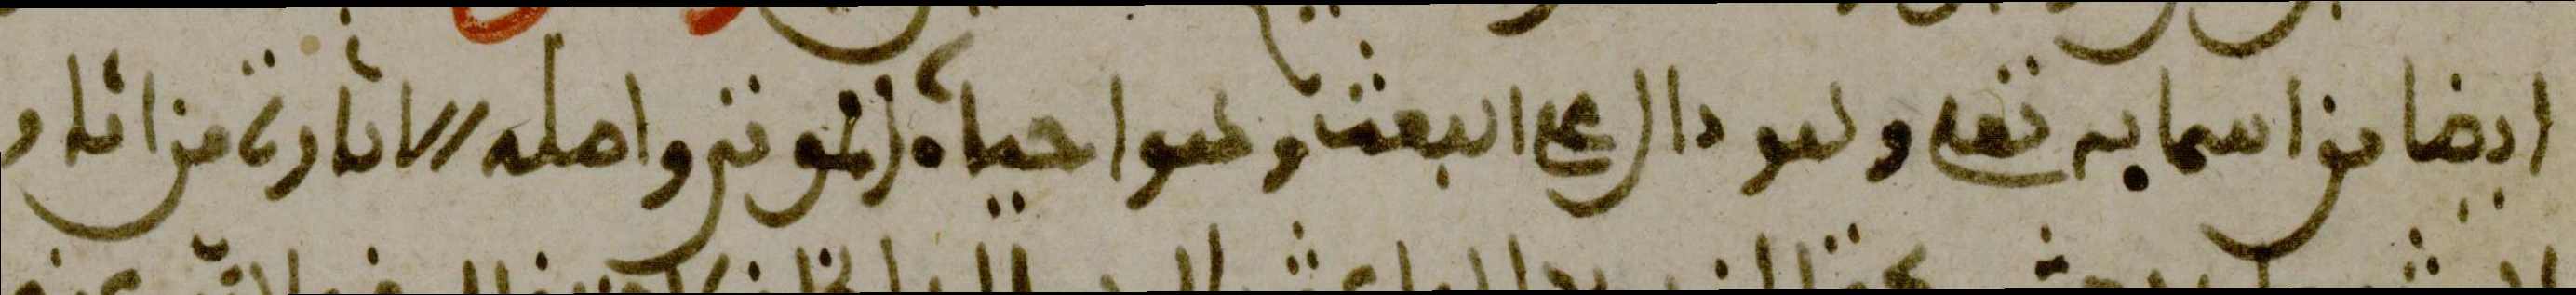ايضا من اسمائه تعلى وهو دال على البعث وهو احياء الموتى واصله الاثارة من اثار
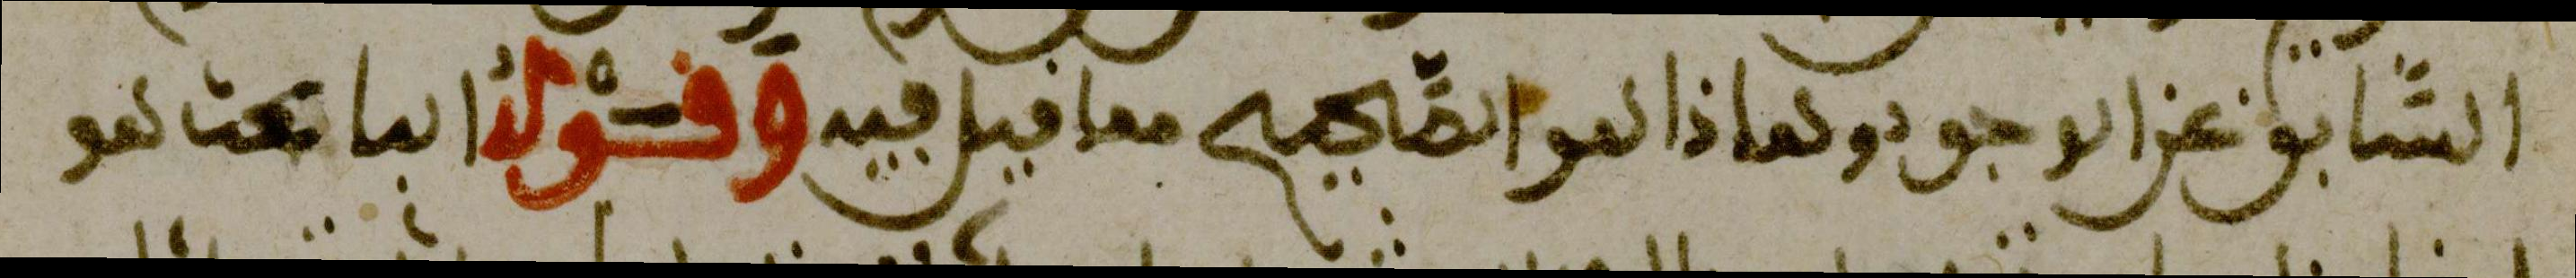السّابق عن الوجود وهاذا هو الصّحيح مما قيل فيه وَقَوْلهُ الباعث هو
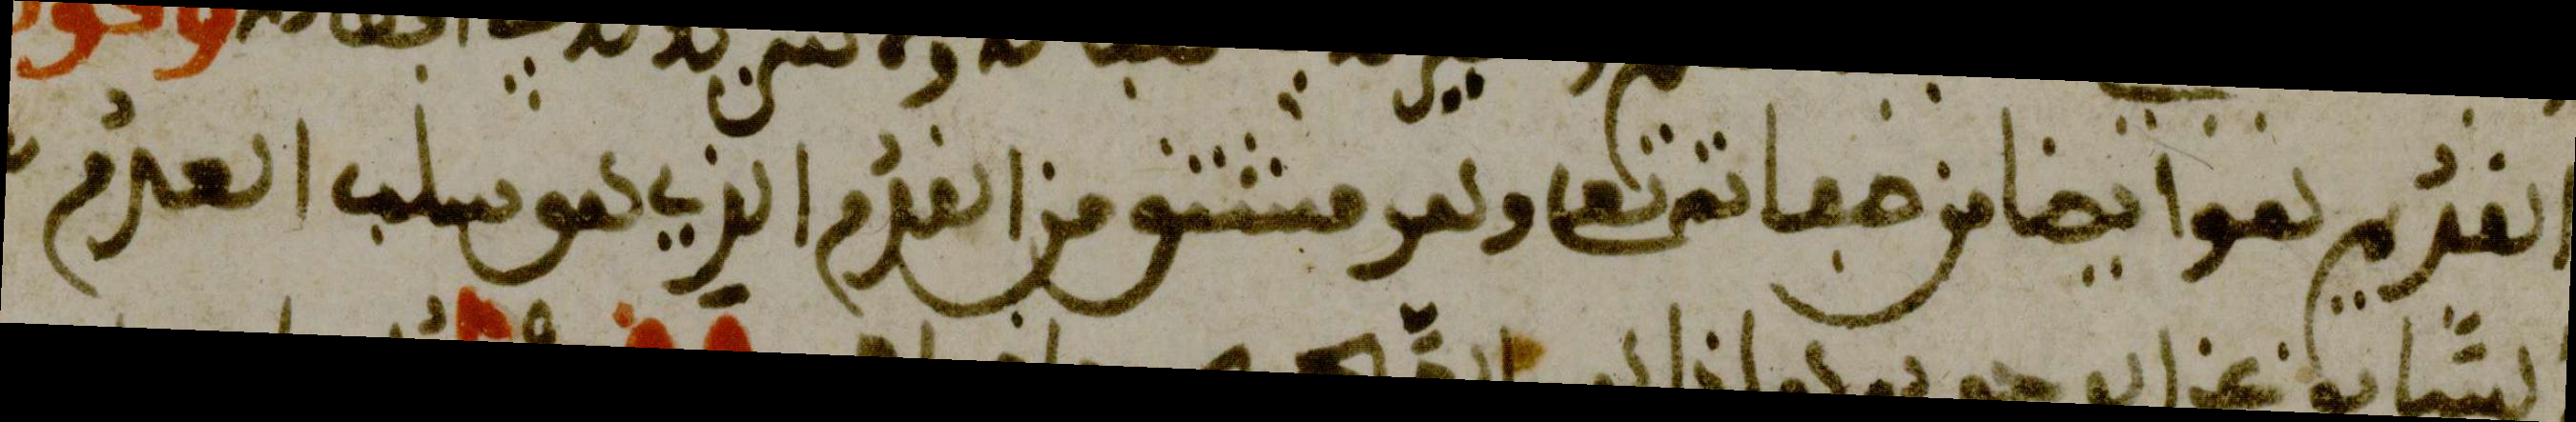القديم هو ايضا من صفاته تعلى وهو مشتق من القدم الذي هو سلب العدم
